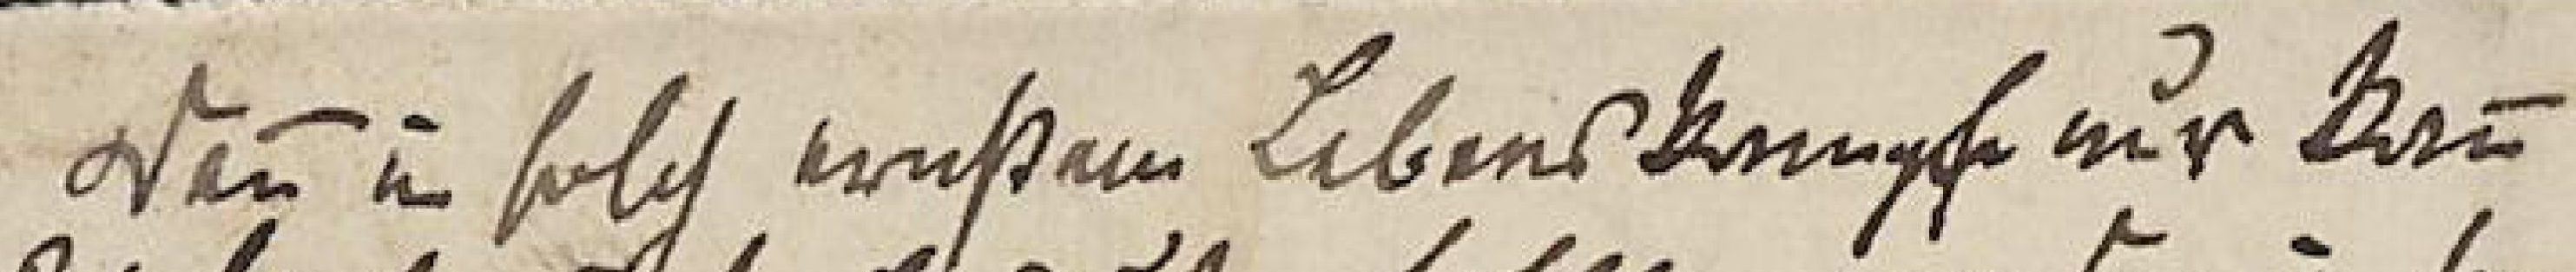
Den in solch ernstem Lebenskampfe nur kan
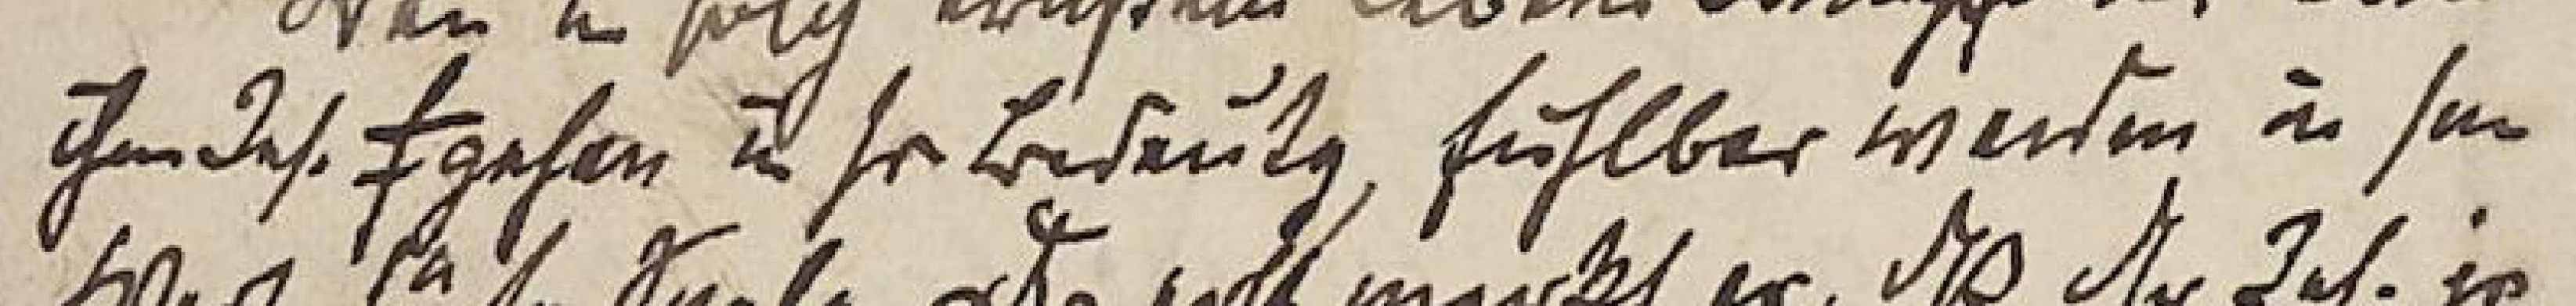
ihm Jes fgehen in sr Bedeutg fühlbar werden in sm
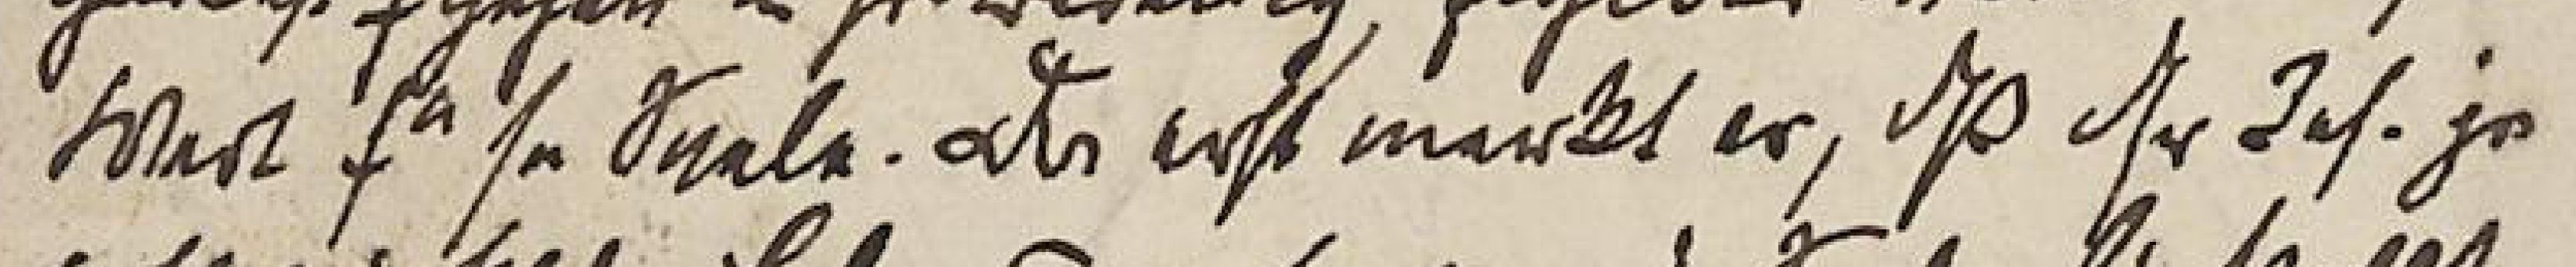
Wert fü sn Seele. Da erst merkt er, daß dsr Jes ja
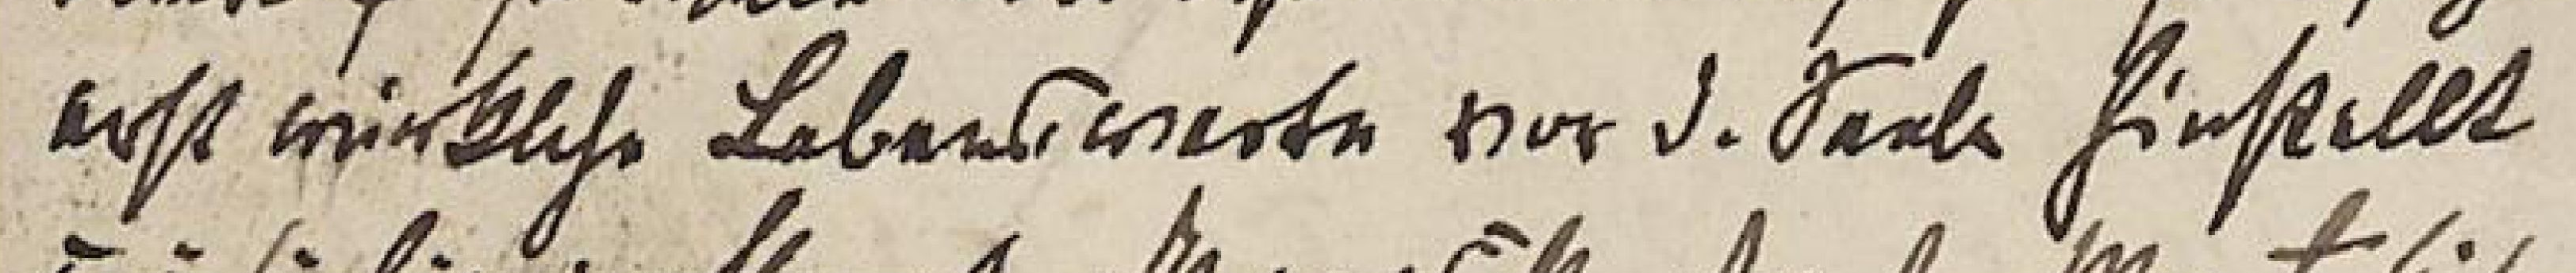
erst wirklche Lebensworte vor d. Seele hinstellt
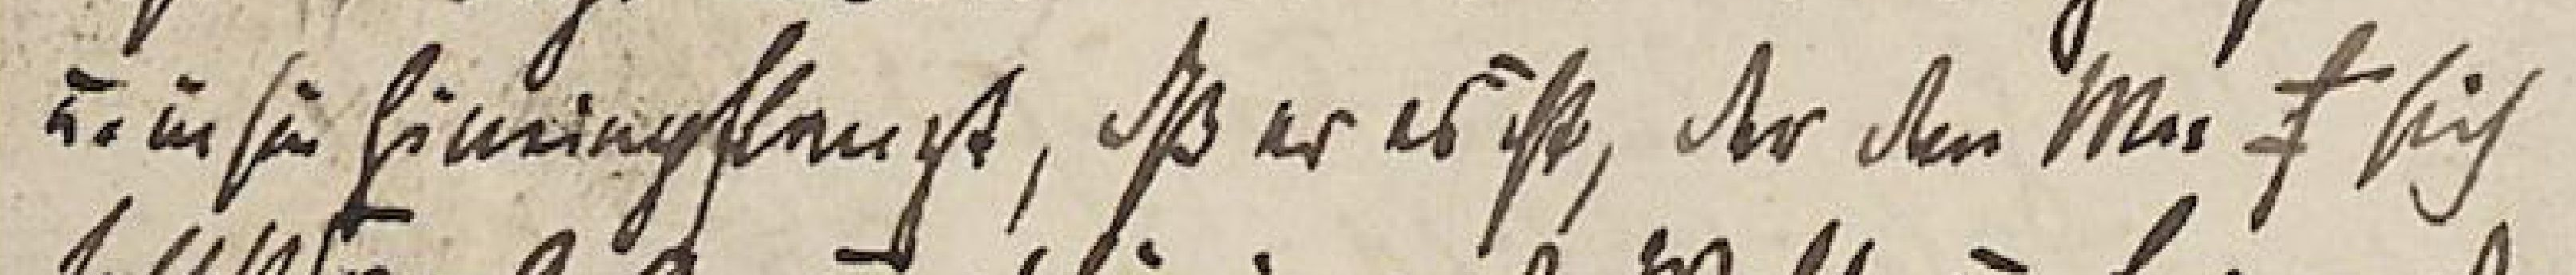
u. in sie hineinpfanzt, da0 er es ist, der den Mn. f. sich
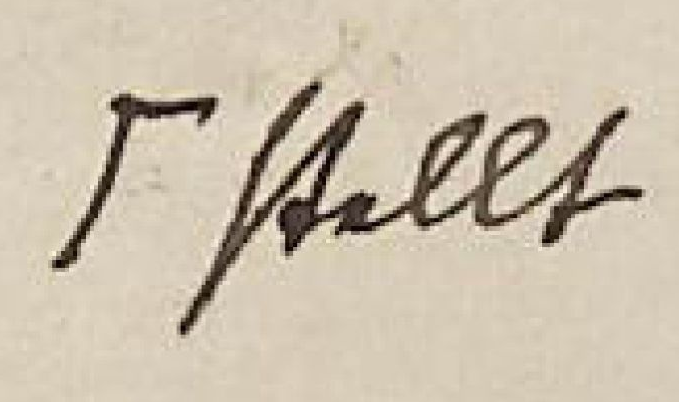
[ stellt
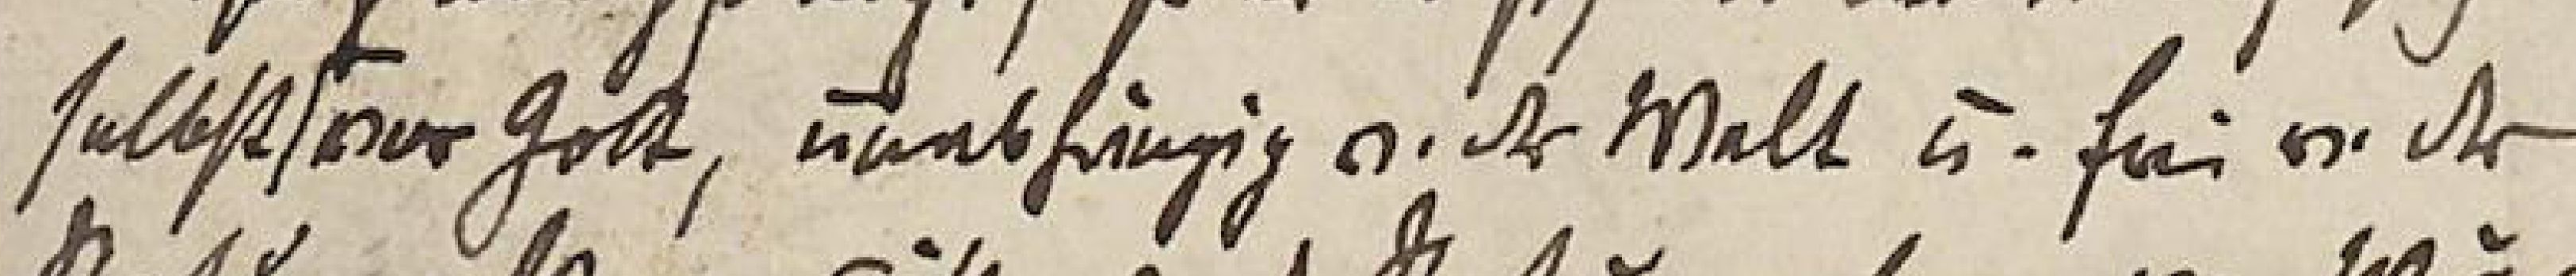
selbst ] vor Gott, unabhängig v. dr Welt u. frei v. der
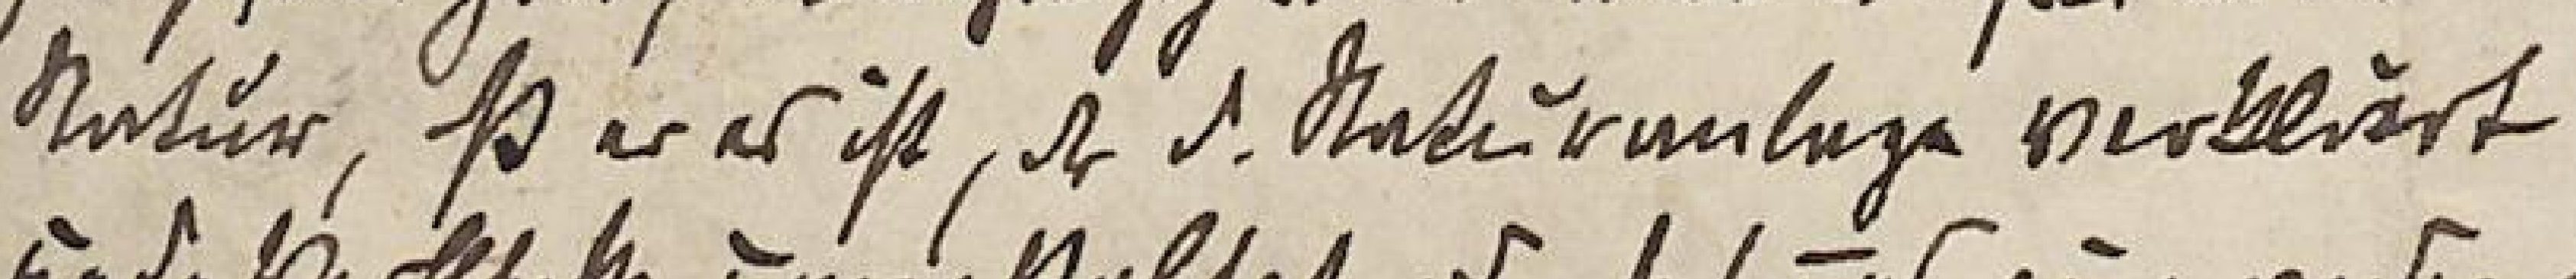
Natur, d0 er es ist, dr di Naturanlage verklärt
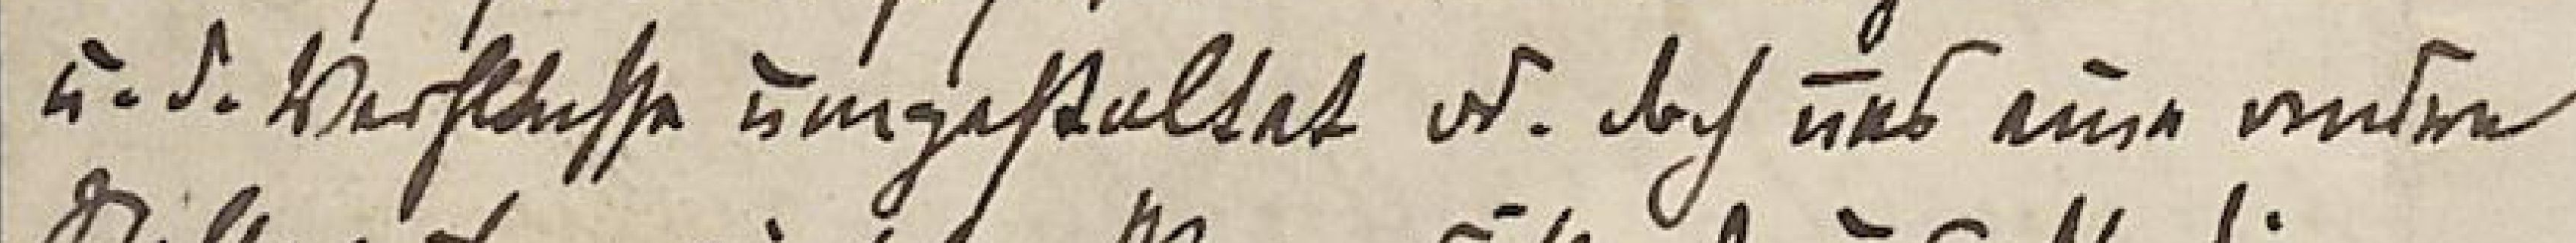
u. d. Verhltnisse umgestaltet od. doch uns eine andre
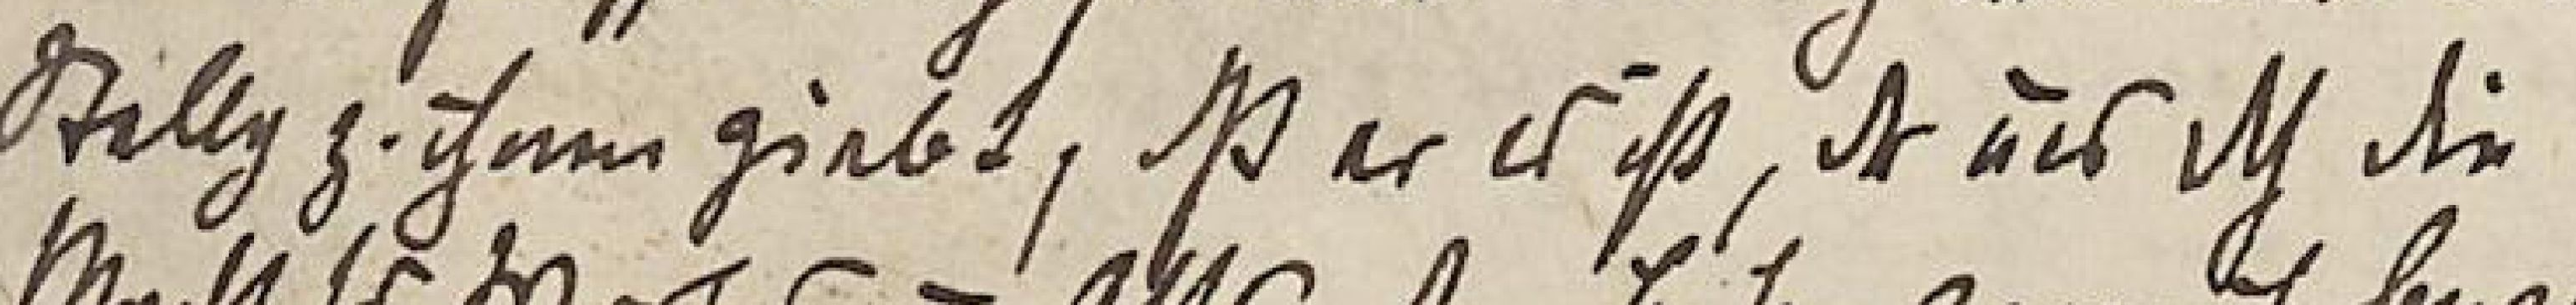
Stllg z. ihnen giebt, dß er es ist, der uns dch die
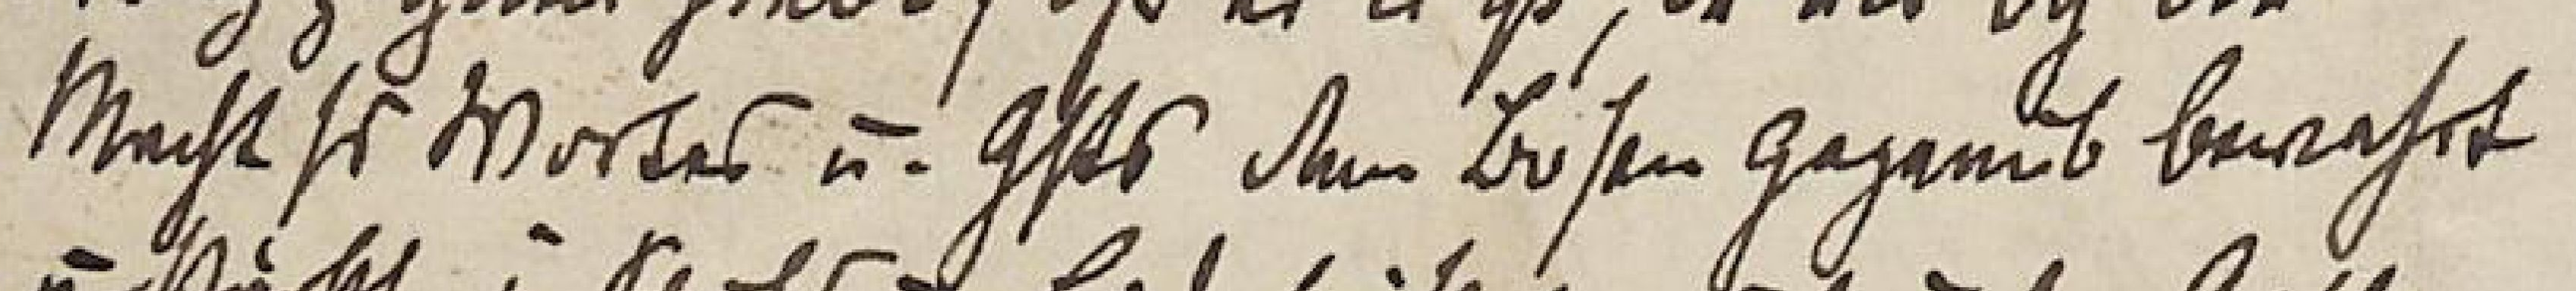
Macht ss Wortes u. Gsts dem Bösen gegenüb. bewahrt
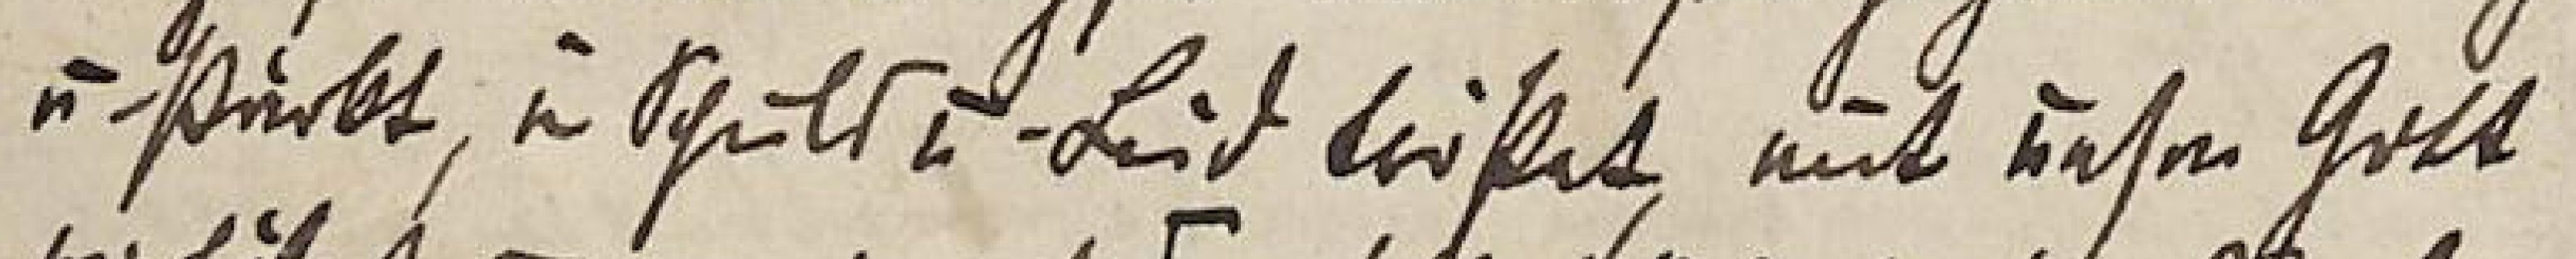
u. stärkt, in Schuld u. Leid tröstet mit unsrm Gott
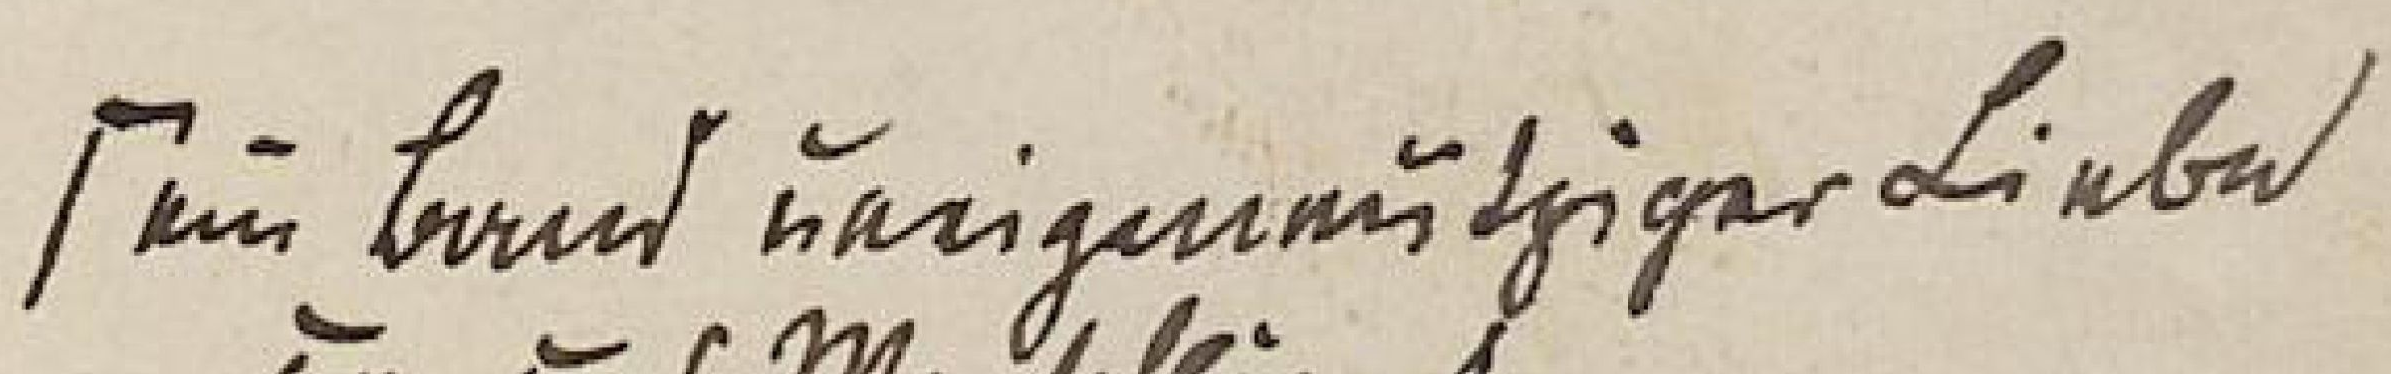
[ ein Band uneigennütziger Liebe
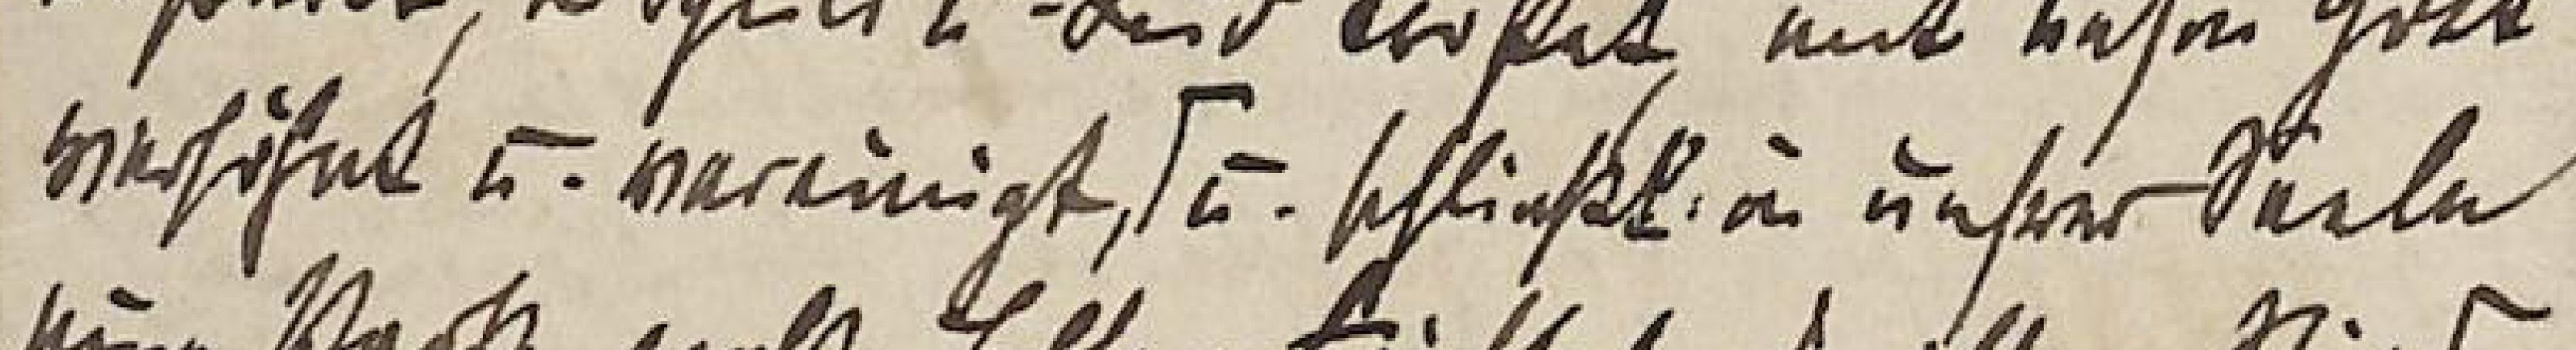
versöhnt u. vereinigt, [ u. schließl. in unsrer Seele
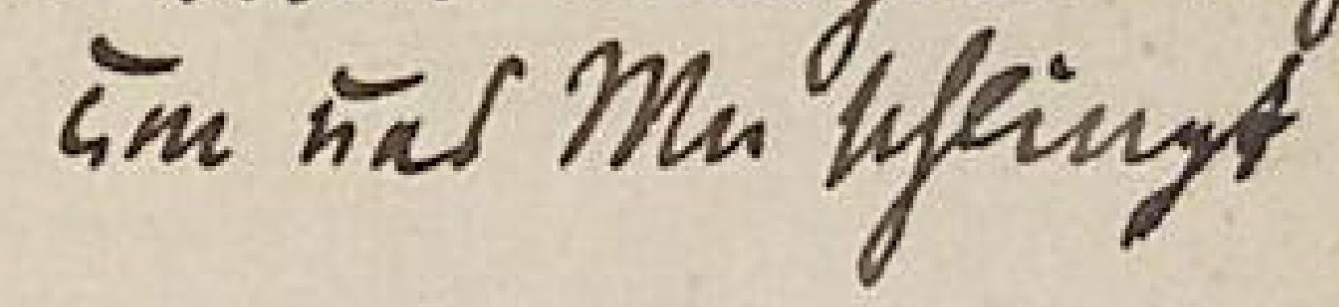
um uns Mn schlingt
